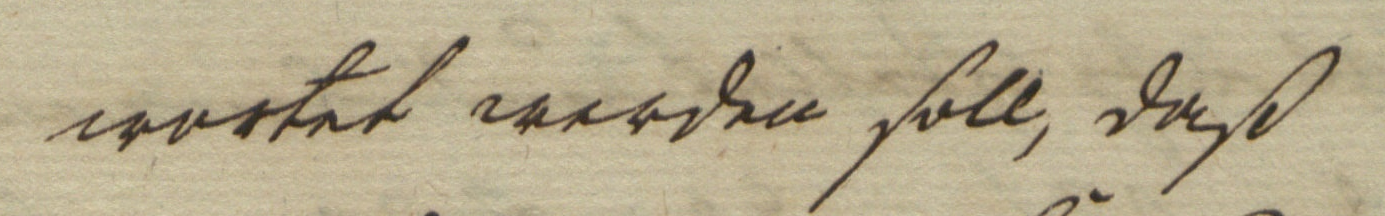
wortet werden soll, daß
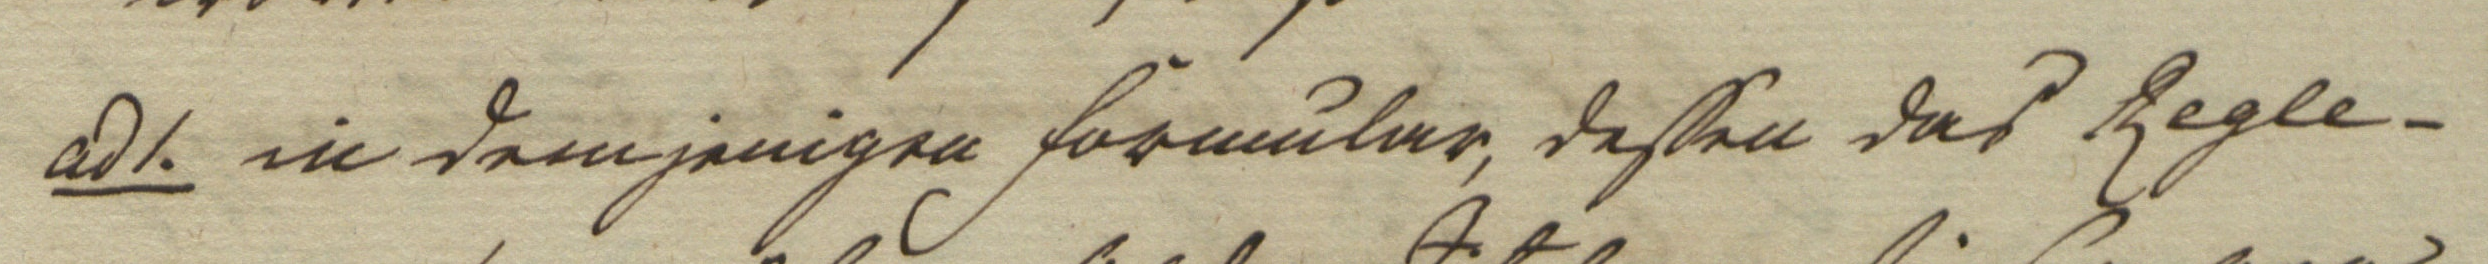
ad1. in demjenigen Formular, dessen das Regle¬
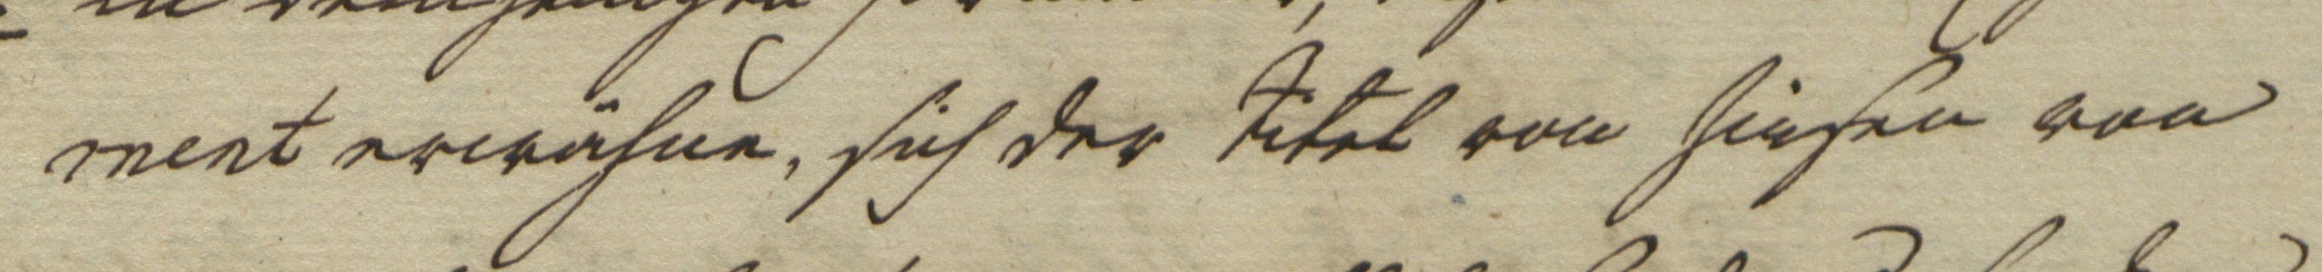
ment erwähne, sich der Titel von Zinsen von
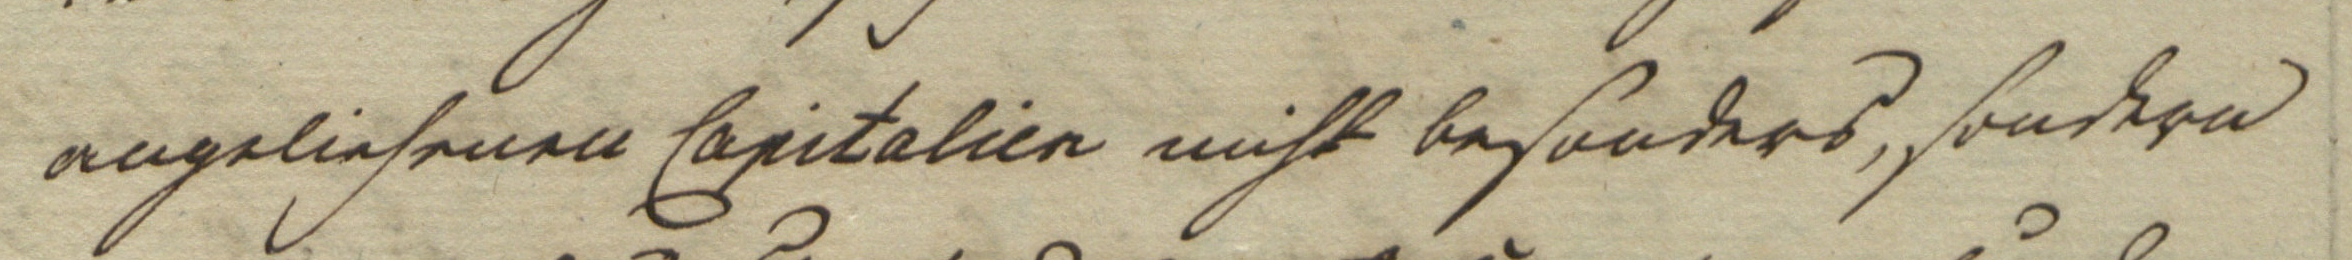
angeliehenen Capitalien nicht besonders, sondern
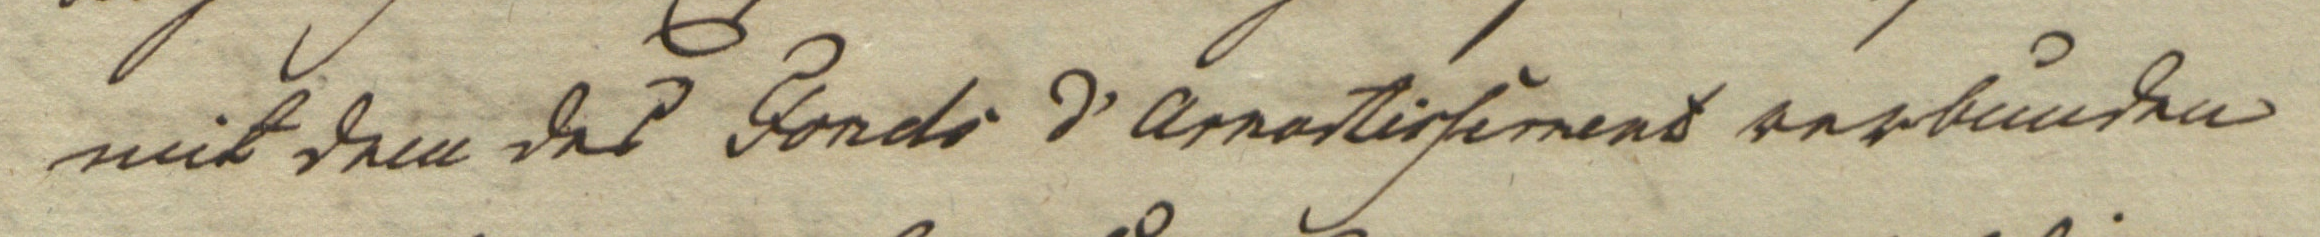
mit dem des Fonds d'Armortissement verbunden
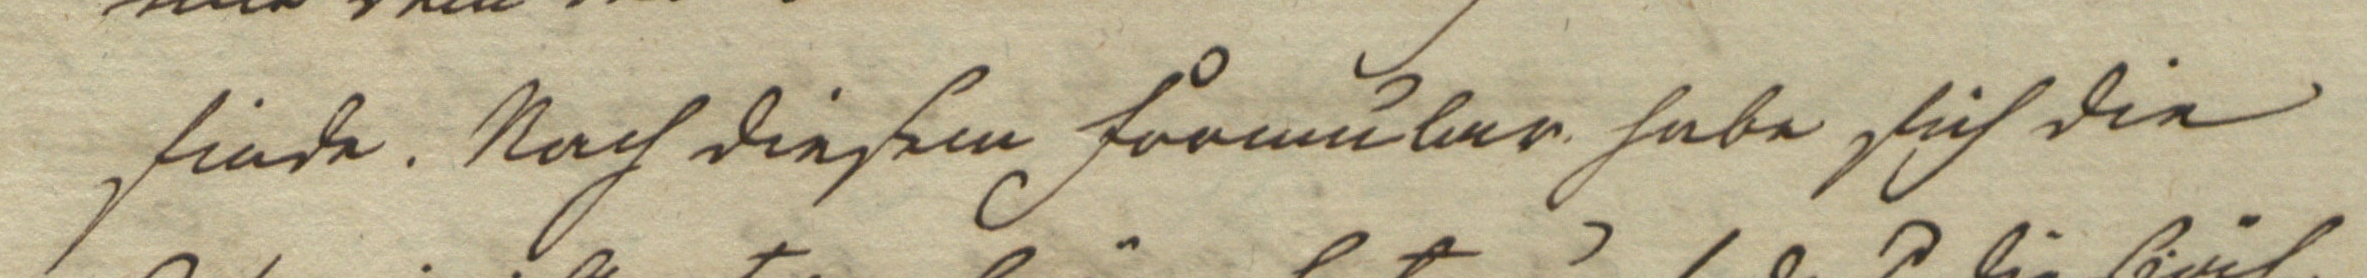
finde. Nach diesem Formular habe sich die
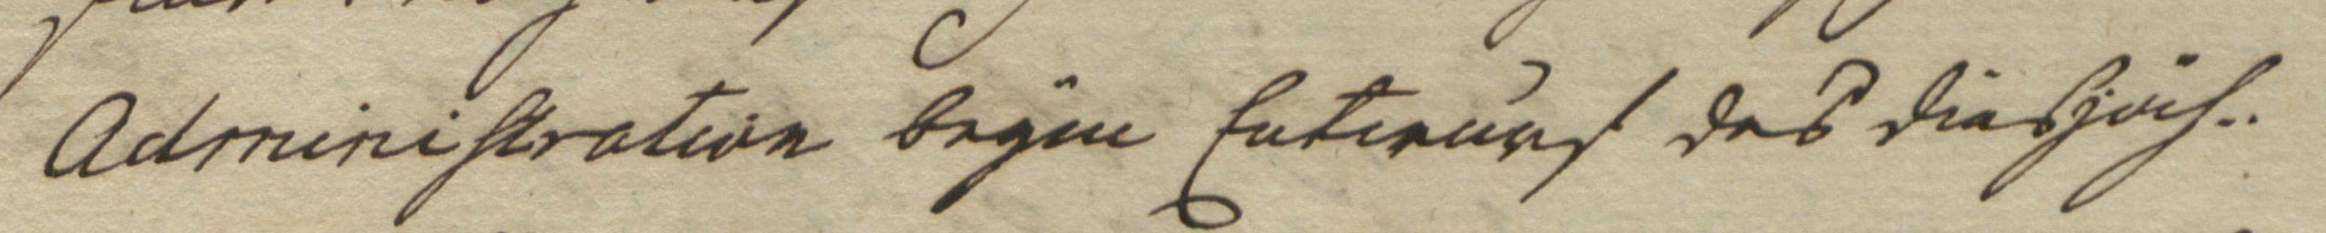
Administration beym Entwurf des diesjäh¬
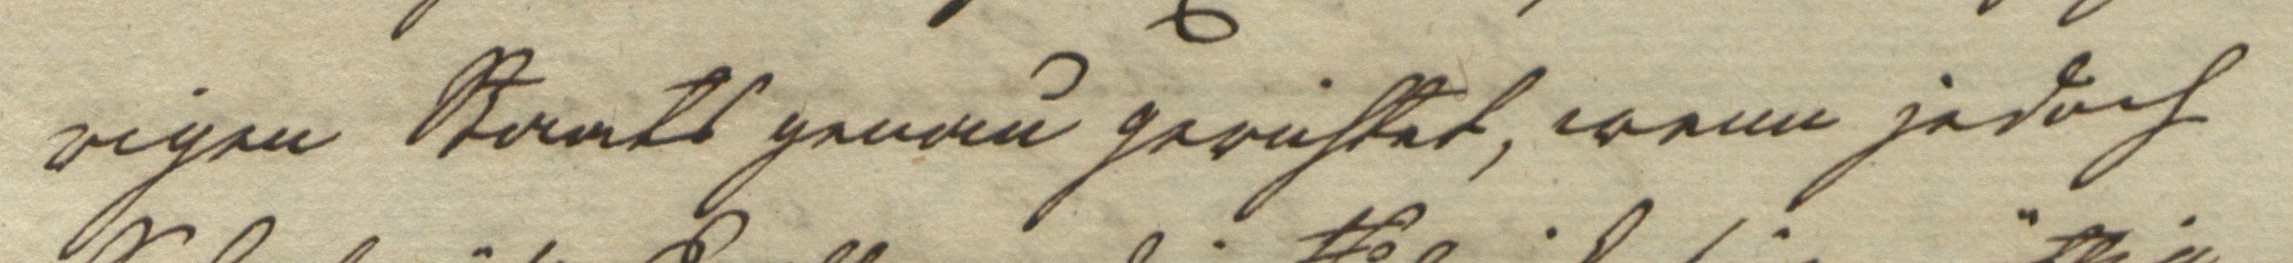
rigen Staats genau gerichtet, wenn jedoch
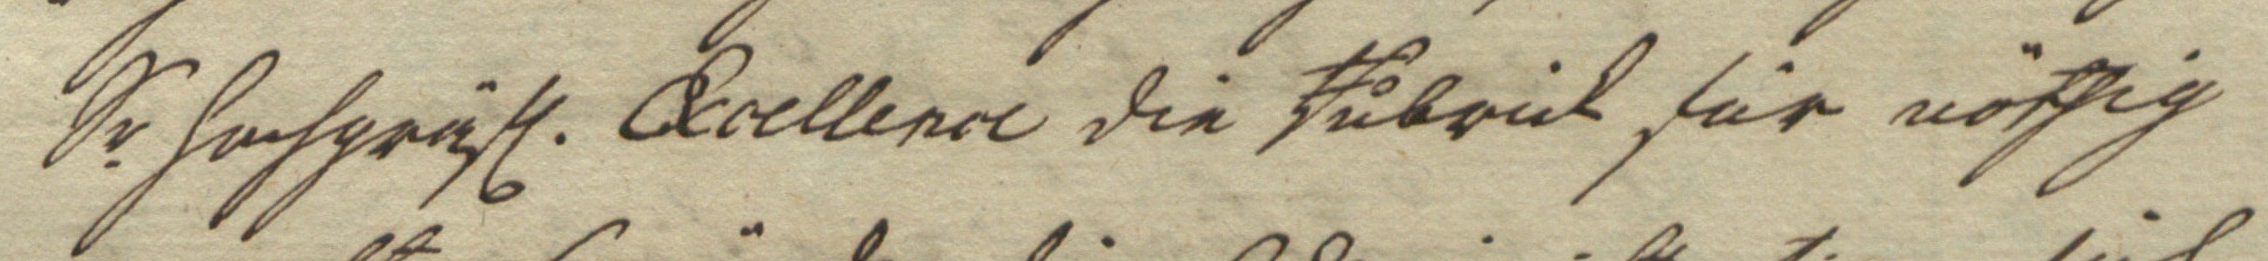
Sr. Hochgräfl. Excellence die Rubrik für nöthig
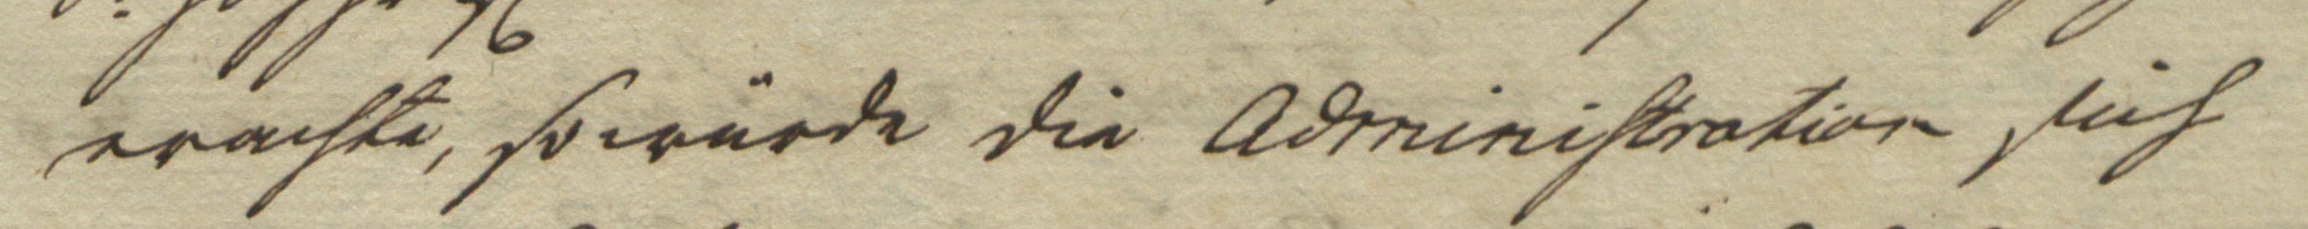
erachte, so würde die Administration sich
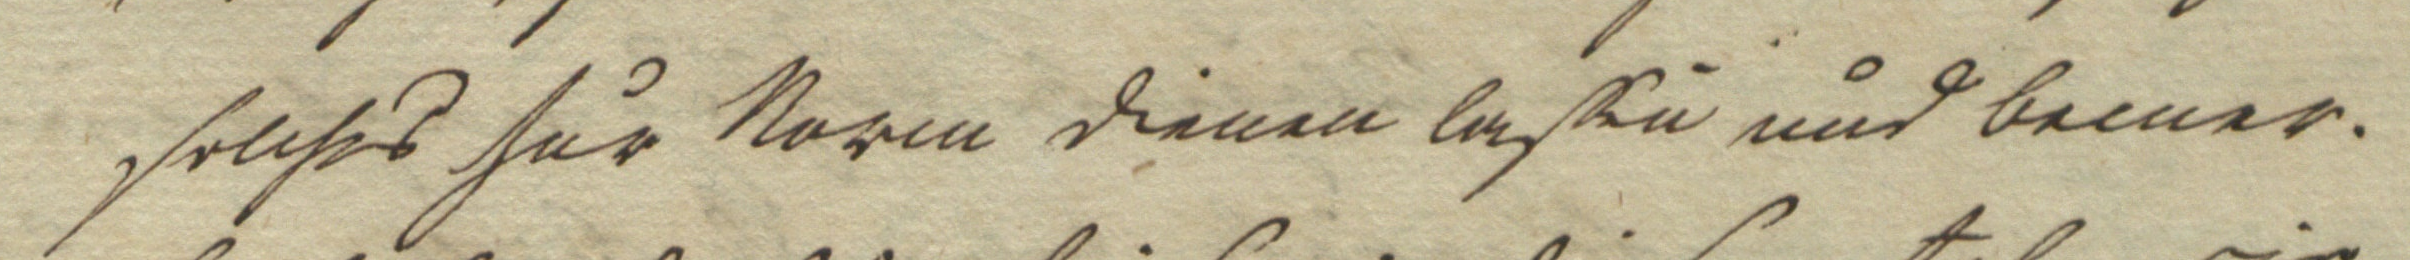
solches zur Norm dienen lassen und bemer¬
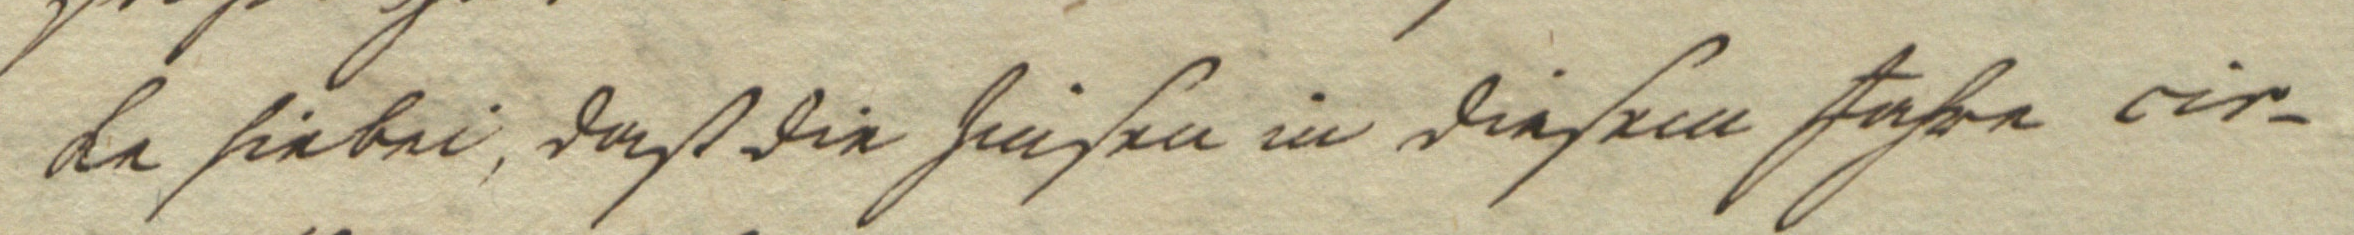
ke hiebei, daß die Zinsen in desem Jahre cir¬
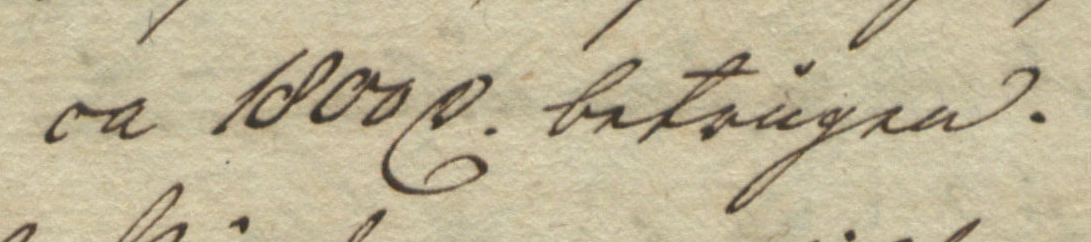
ca 1800 rtl. betrügen.
